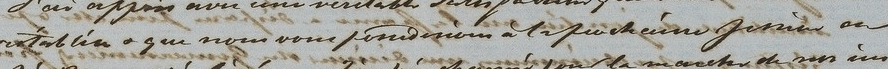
rétablie & que nous vous possiderions à la prochaine session de
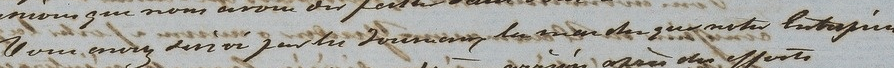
Vous aurez suivi par les Journaux la marche que notre Entreprise
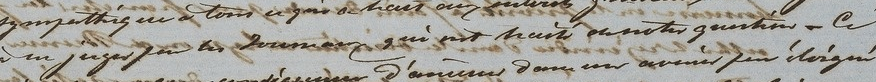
à en juger par les Journaux qui ont traité de notre question – Ce
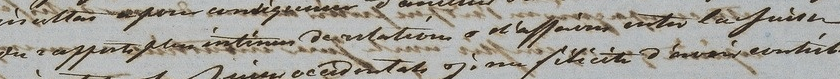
des rapports plus intimes de relations & d'affaires entre la Suisse
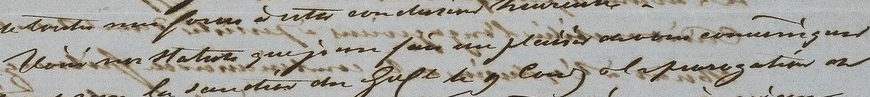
Voici nos statuts que je me fais un plaisir de vous communiquer –
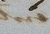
nous
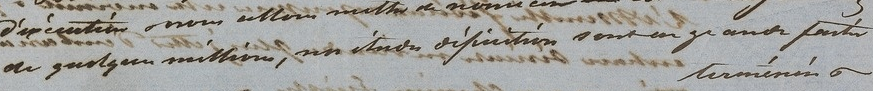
de quelques millions, nos études définitives sont en grande partie
